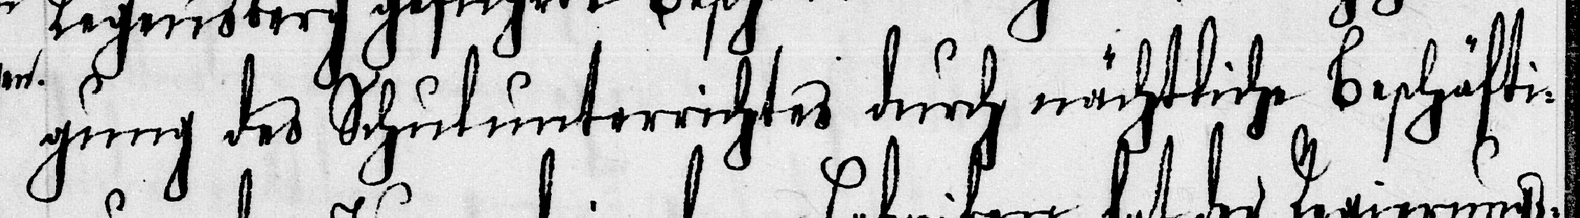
gung des Schulunterrichtes durch nächtliche Beschäfti¬
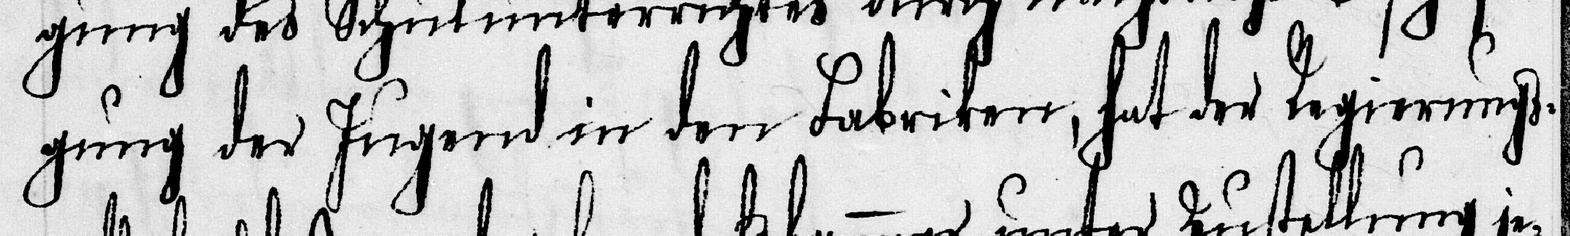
gung der Jugend in den Fabriken, hat der Regierung¬
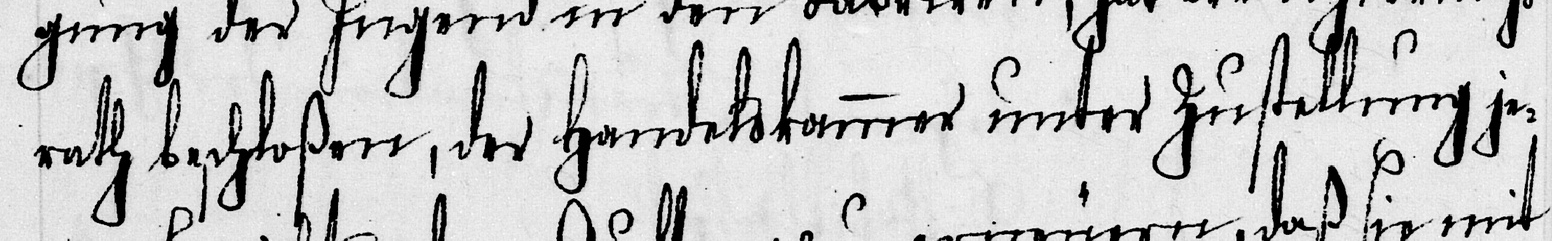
rath beschloßen, der Handelskammer unter Zustellung j¬
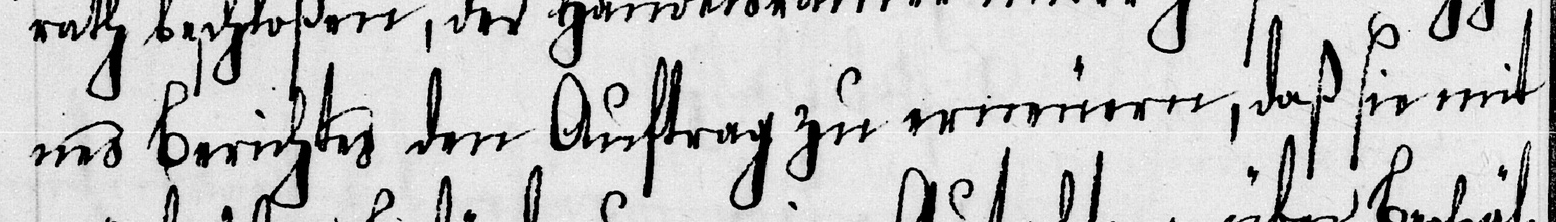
enes Berichtes den Auftrag zu erneuern, daß sie mit
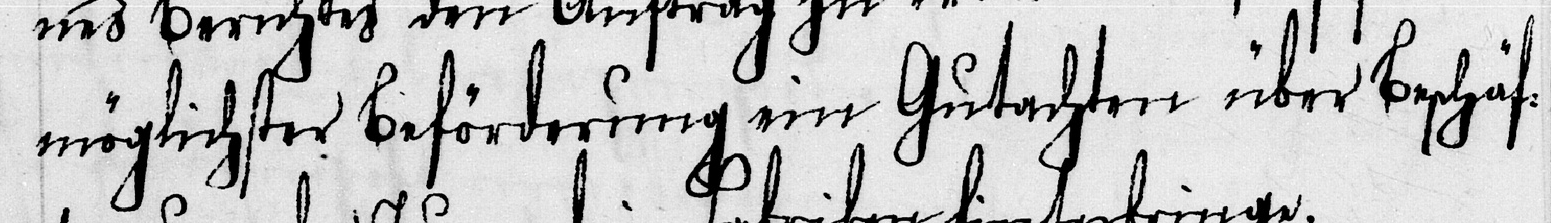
möglichster Beförderung ein Gutachten über Beschäf¬
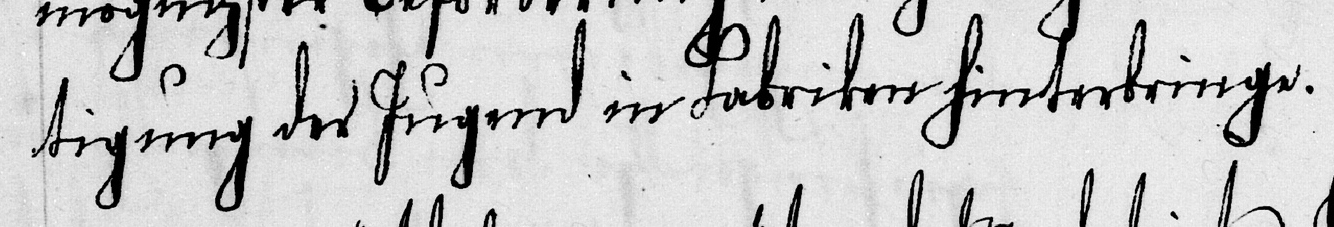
tigung der Jugend in Fabriken hinterbringe.
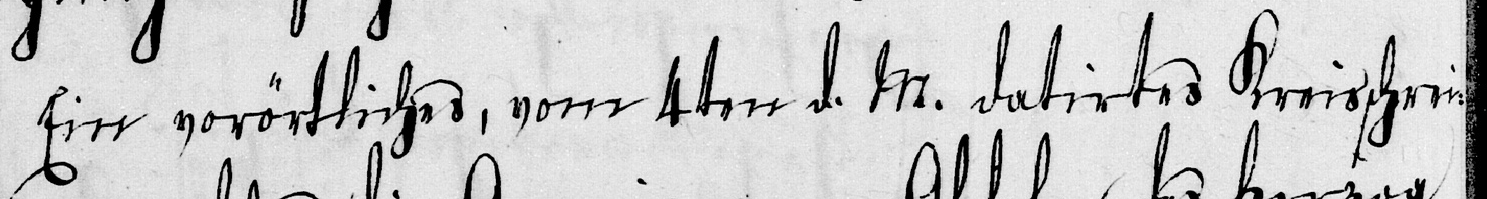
Ein vorörtliches, vom 4ten d. M. datirtes Kreisschrei¬
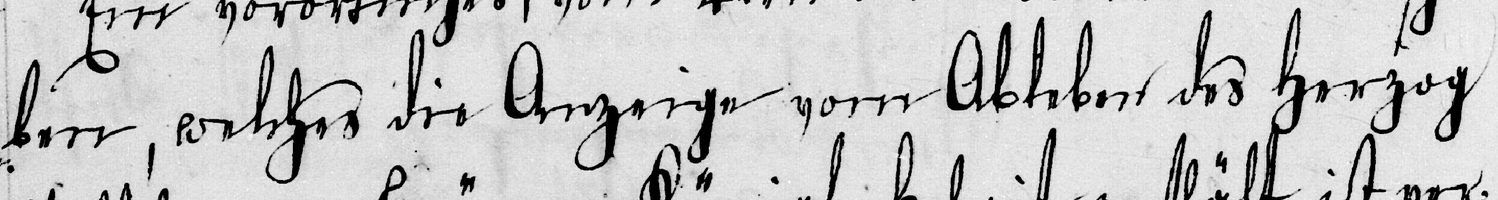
ben, welches die Anzeige vom Ableben des Herzogs
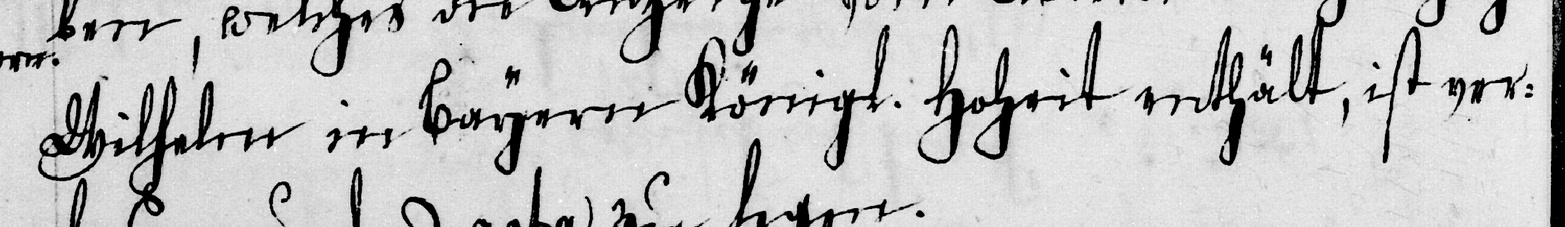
Wilhelm in Bayern Königl. Hoheit enthält, ist ver¬
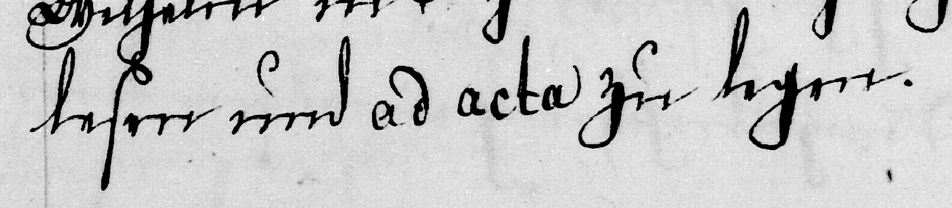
lesen und ad acta zu legen.
